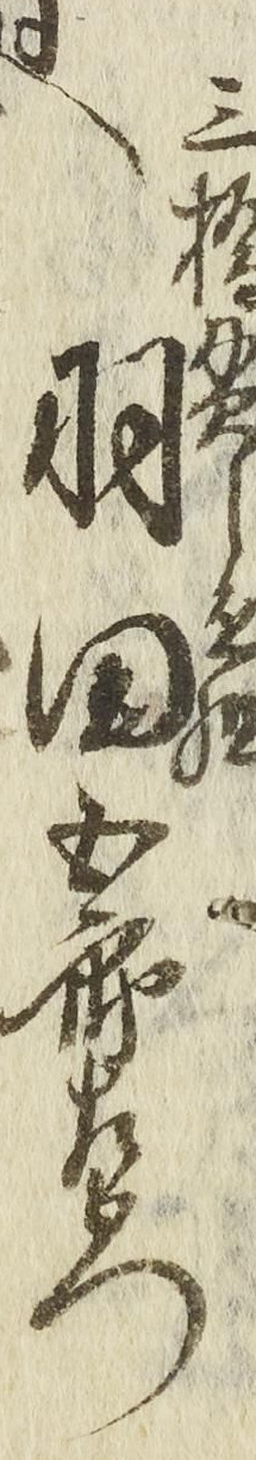羽田五郎左衛門
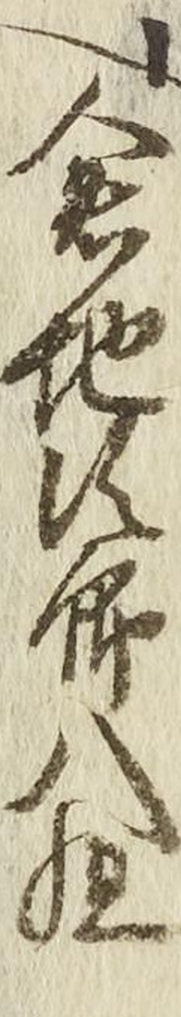倉地次郎八組
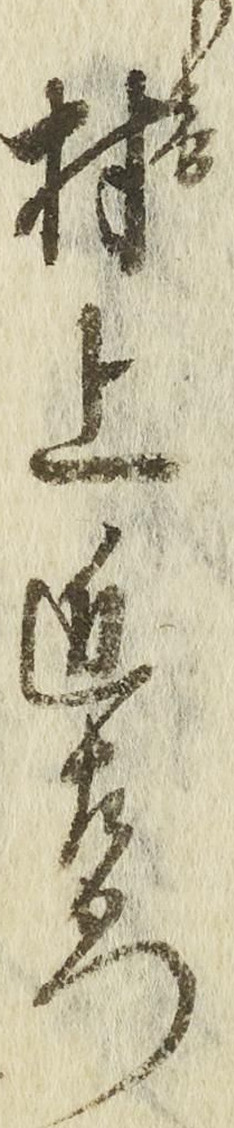村上近左衛門
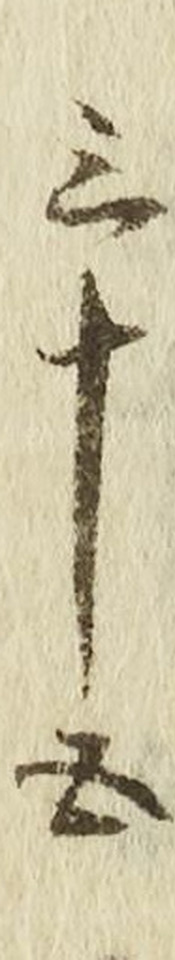三十五
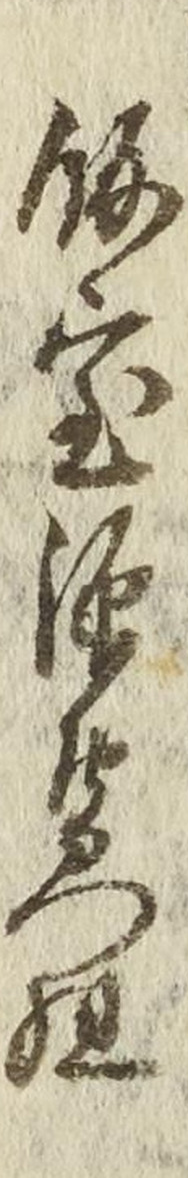飯室源左衛門組
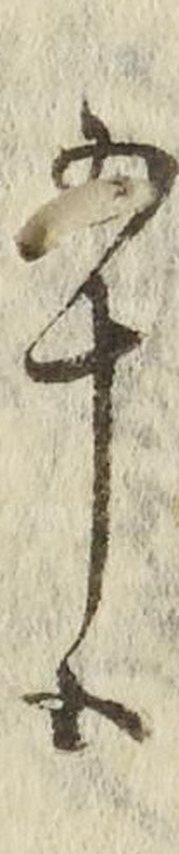五十五
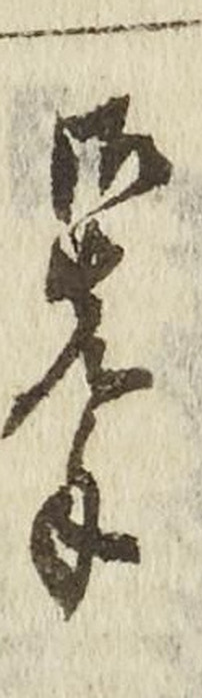御先手
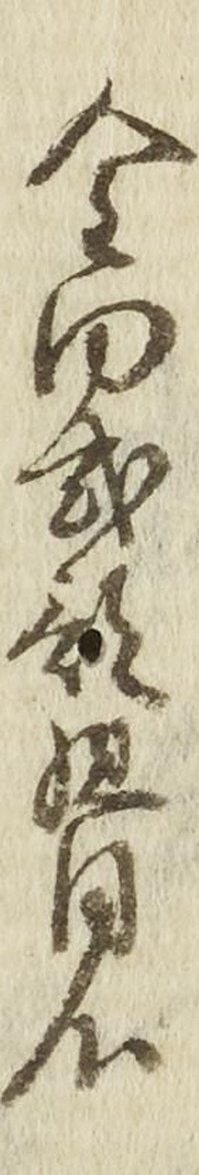金田式部組同心
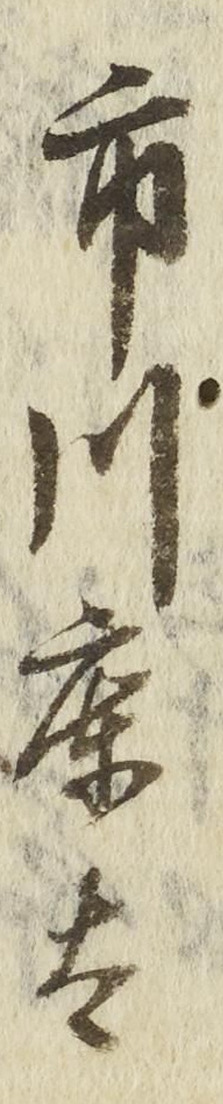市川庫太
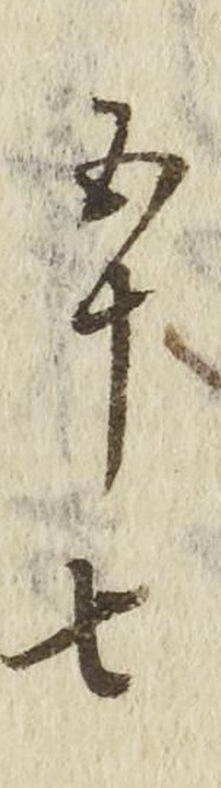五十七
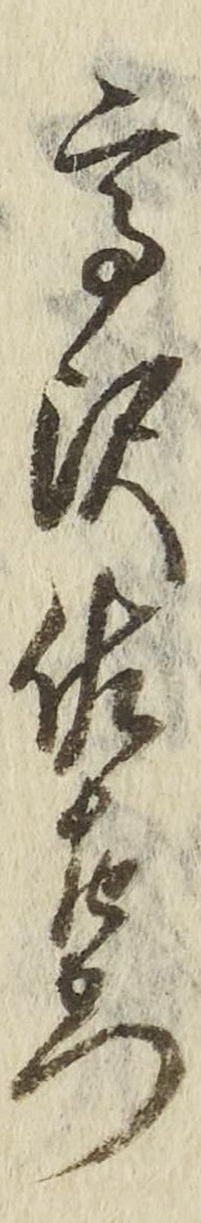高沢佐左衛門
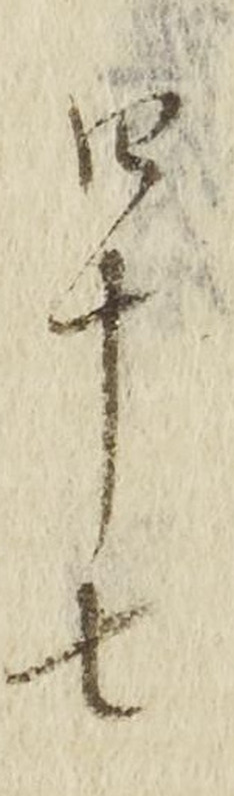四十七

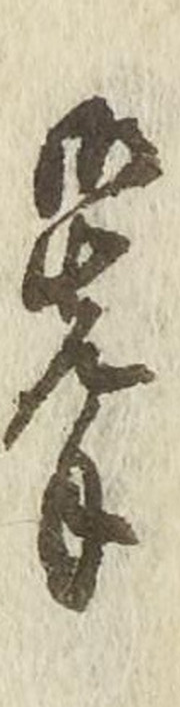御先手
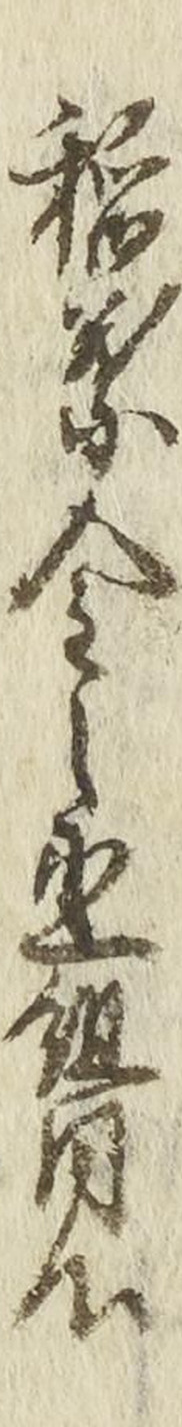稲葉金之丞組同心
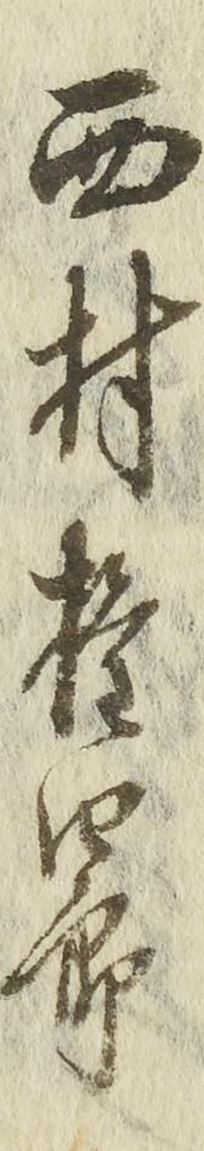西村権四郎
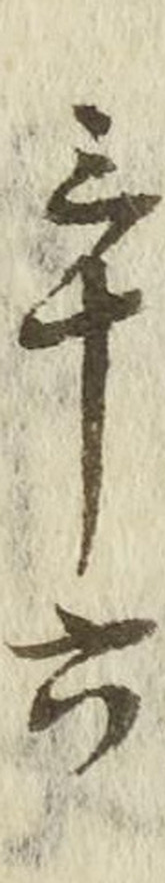三十四
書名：世説ヤンレフシ写、駿州田中城地震ニ付内外破損御届書、豫州大洲城地震ニ付内外破損御届書・封廻状
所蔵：東京大学地震研究所図書室 Earthquake Research Institute Library, The University of Tokyo, JAPAN
